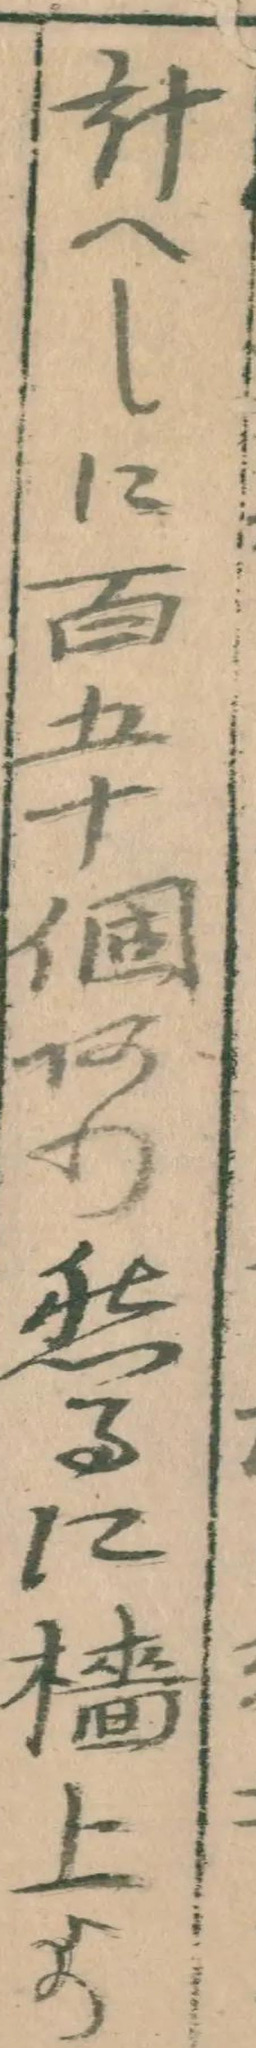計へしに百五十個あり然るに檣上より
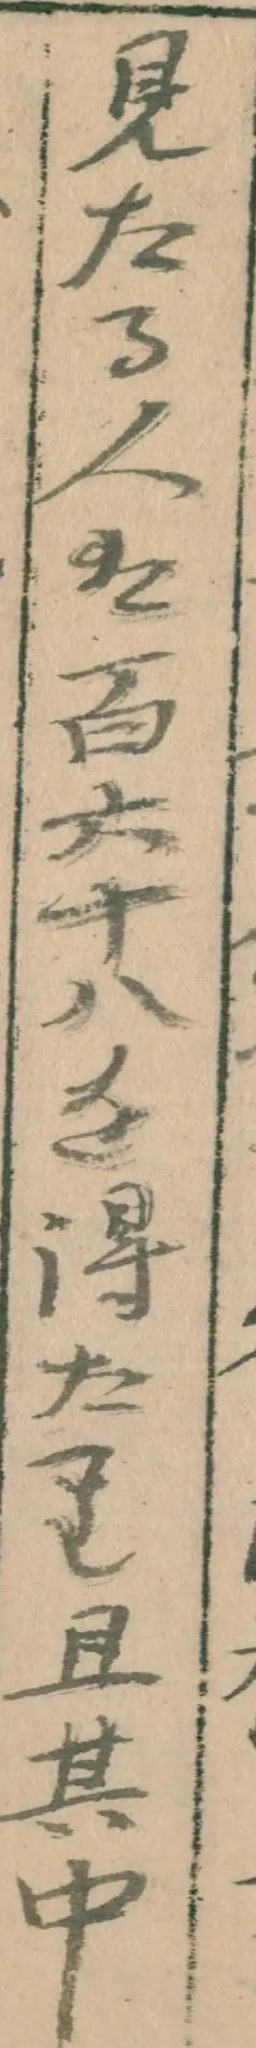見たる人は百六十八を得たり且其中
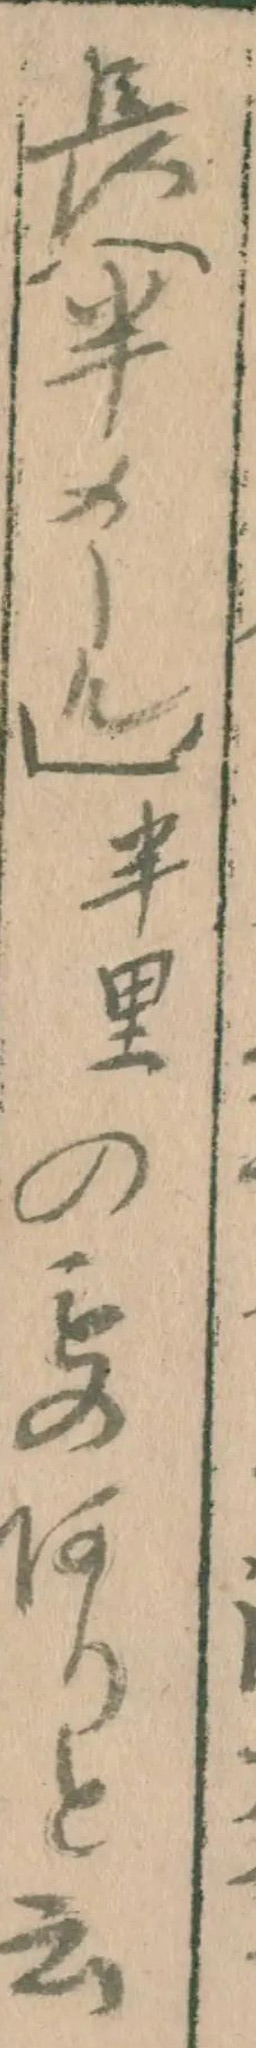長(半メール)半里のものありと云
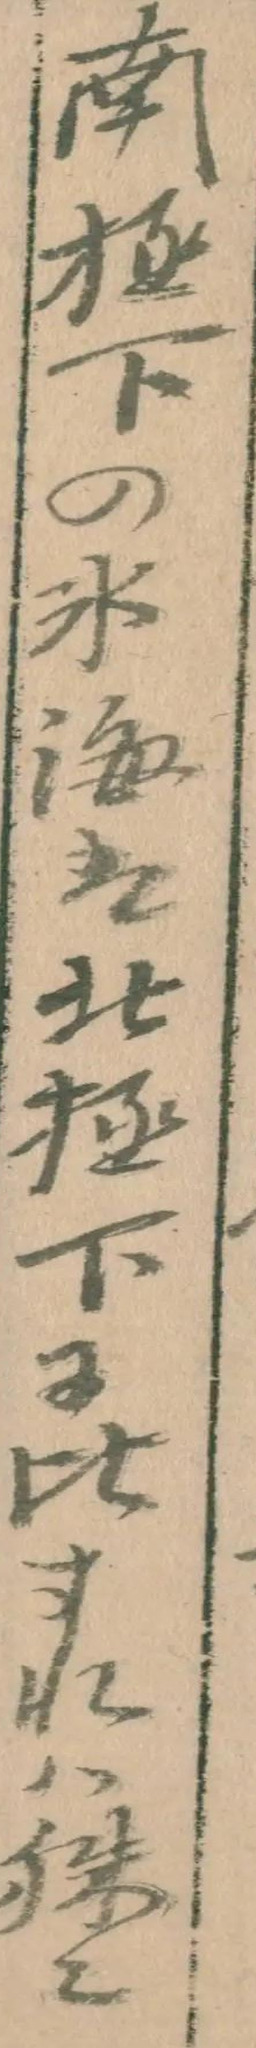南極下の氷海は北極下に比すれは殊に
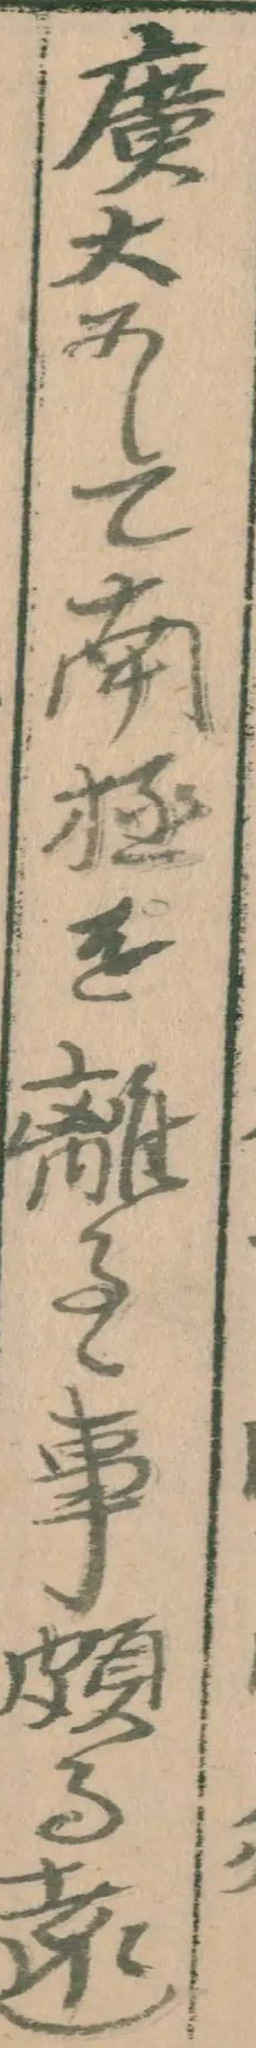広大にして南極を離るゝ事頗る遠
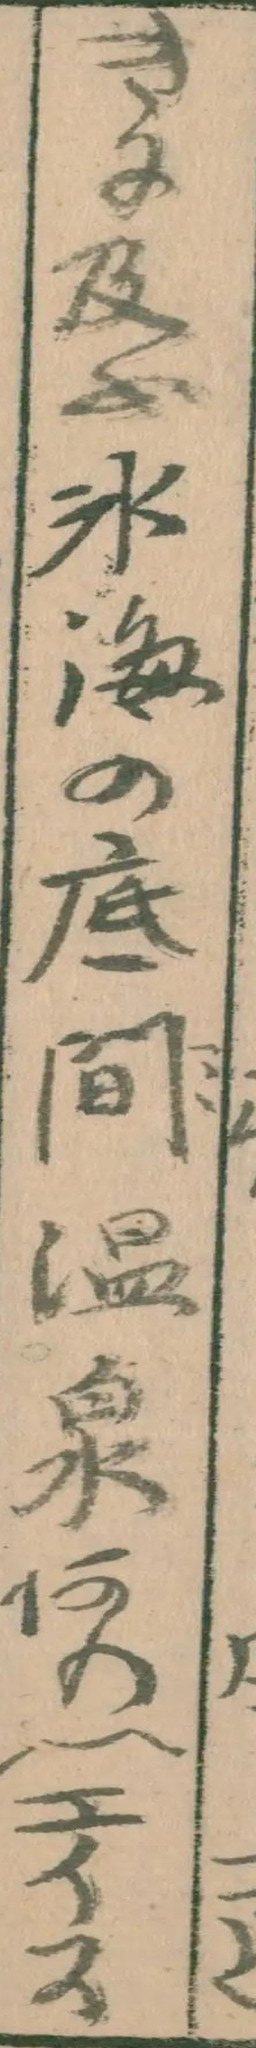きに及ふ氷海の底間温泉あり(エイス
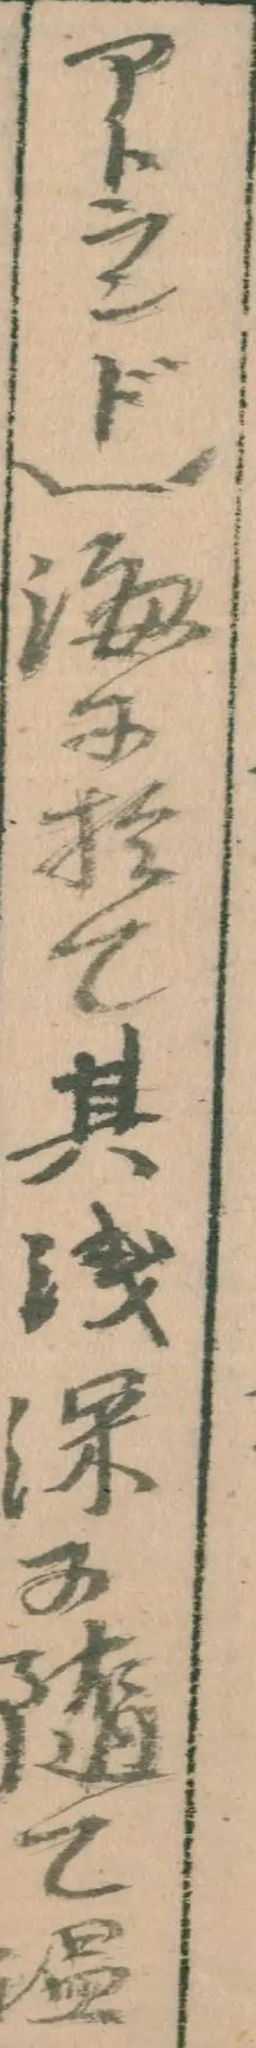アトランド)海に於て其浅深に随て温
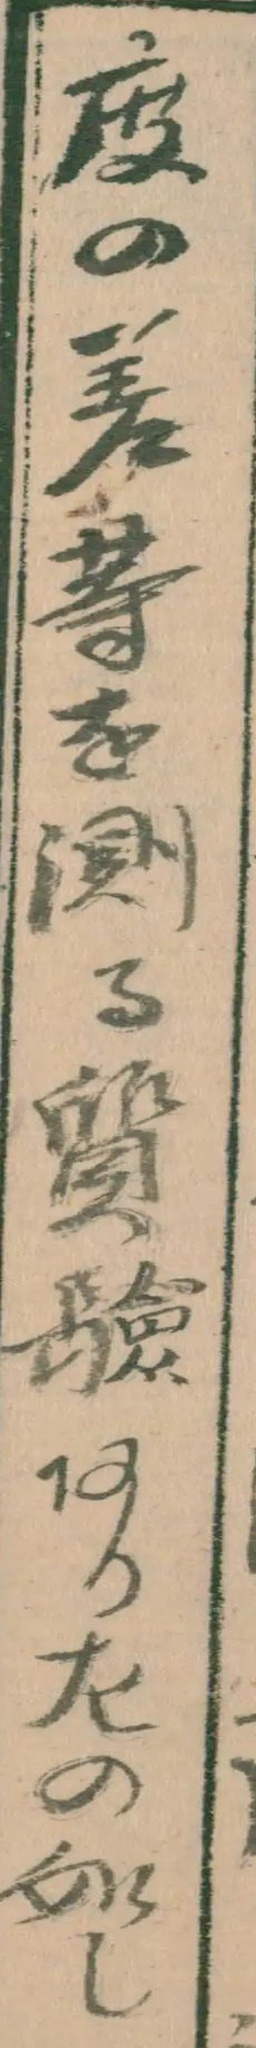度の差等を測る質験あり左の如し
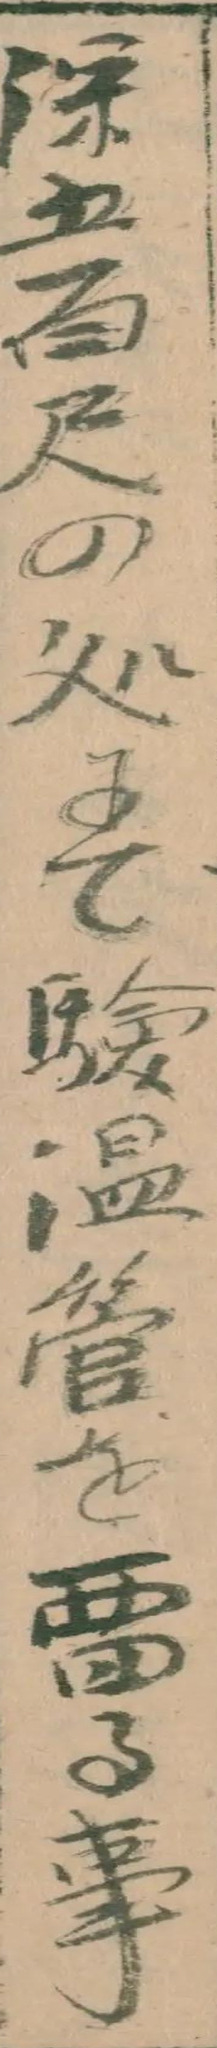深五百尺の処にて験温管を留る事
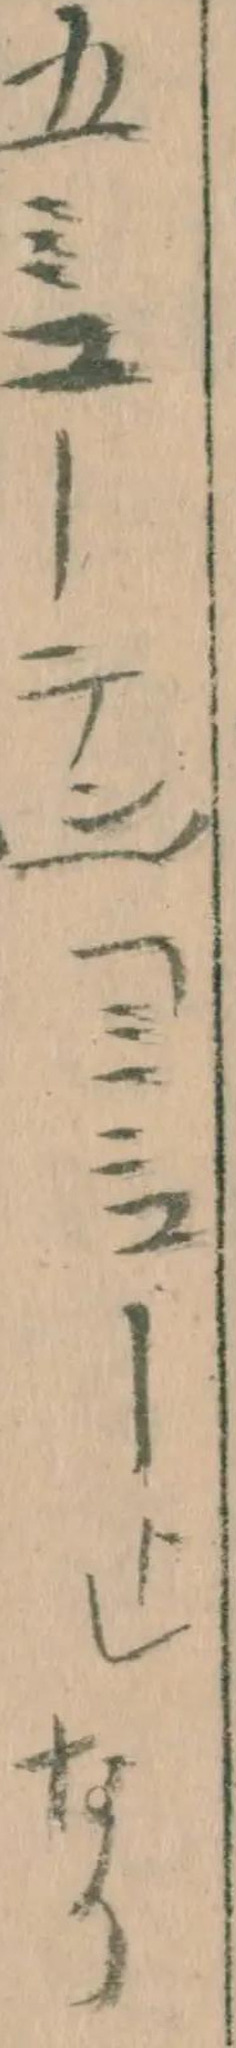五ミユーテン)「ミニュート」なり
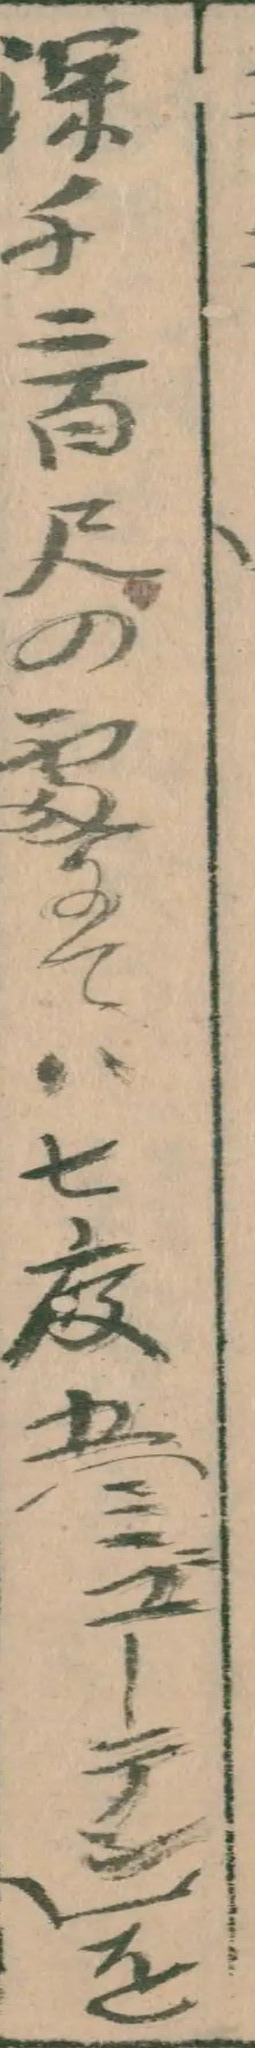深千二百尺の処にては七度五(ミニユーテン)を
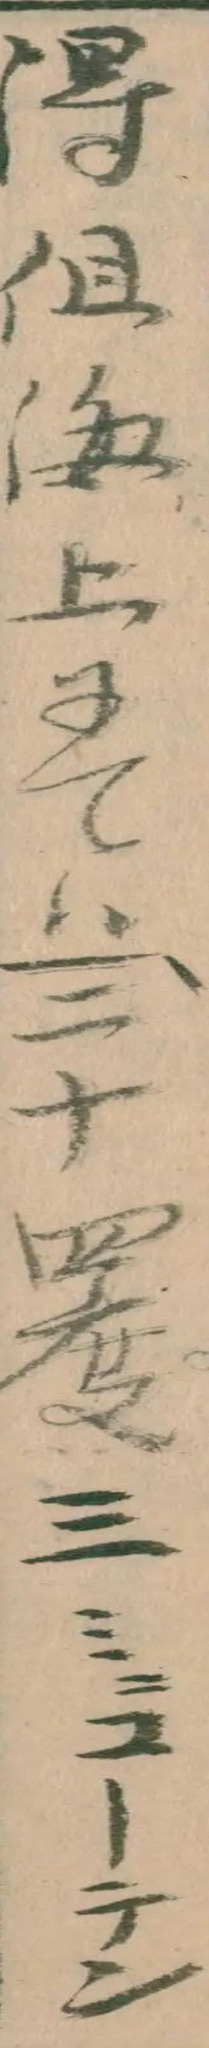得但し海上にては(二十四度三ミニユーテン
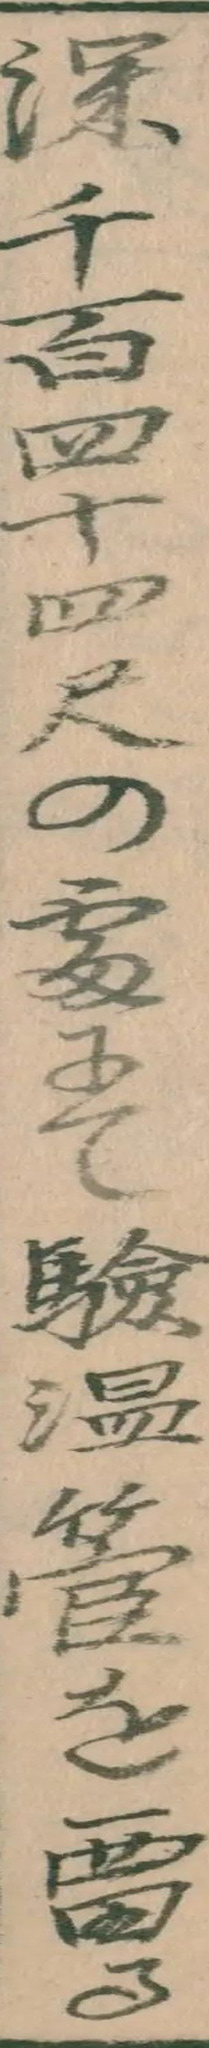深千百四十四尺の処にて験温管を留る
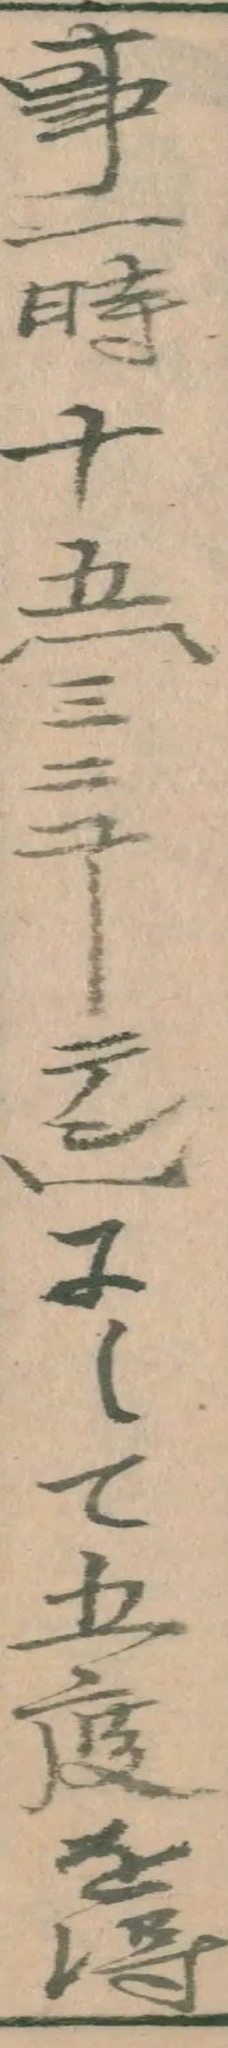事一時十五(ミニユーテン)にして五度を得
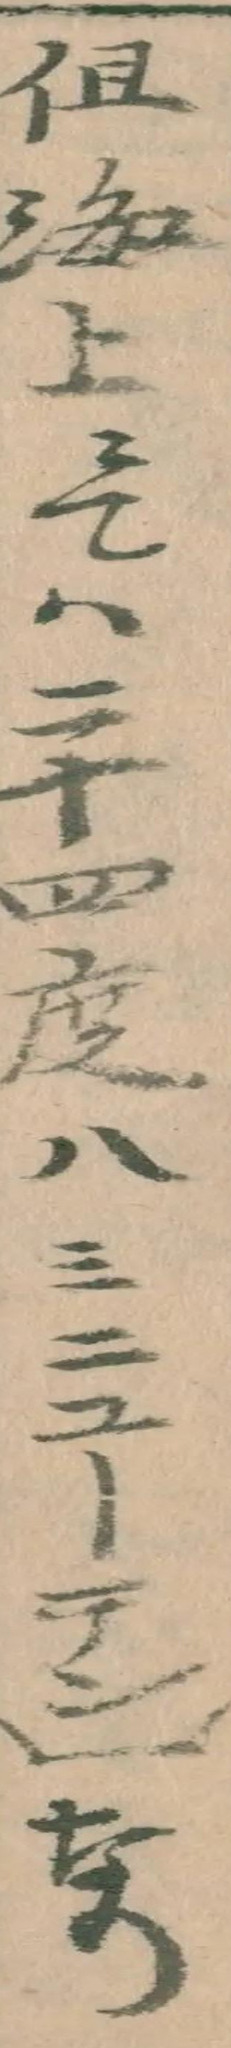但海上にては二十四度八ミニユーテン)なり
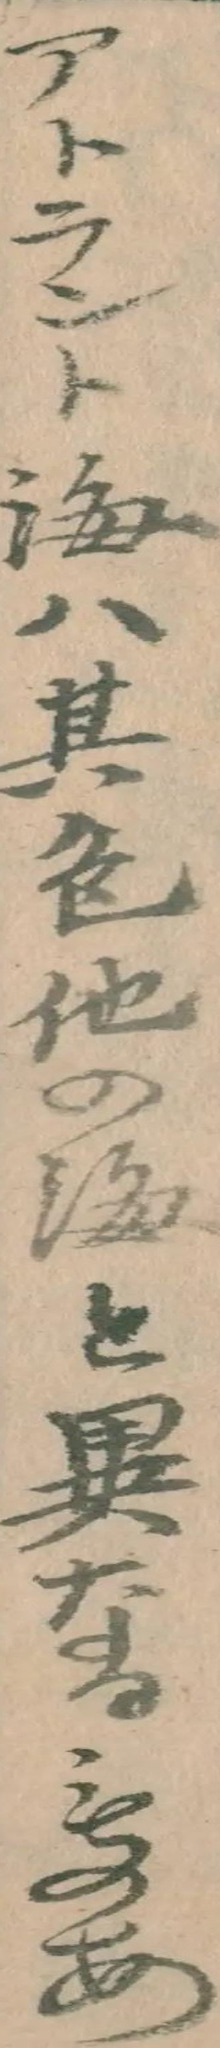アトラント海は其色他の海と異なるものあ
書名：新釈輿地図説
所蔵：国立国会図書館 National Diet Library, JAPAN
